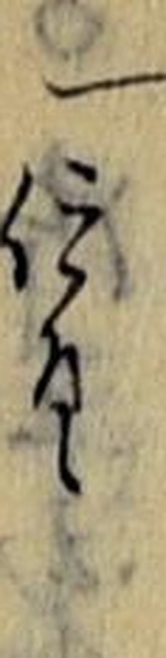仰付候
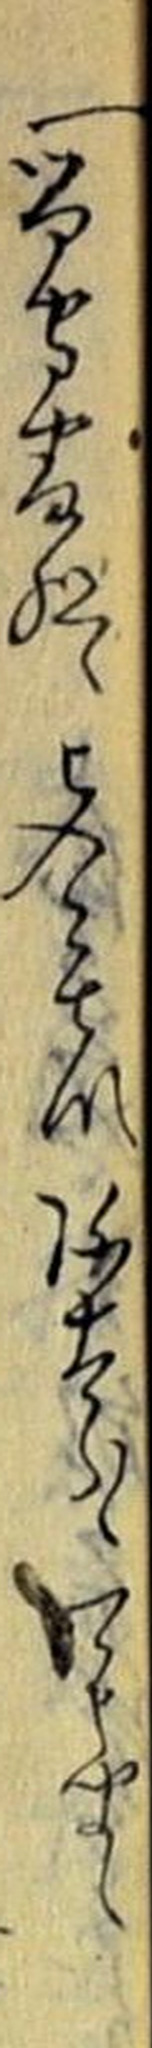留守番組へ被入候其段弥太郎へ可申聞候
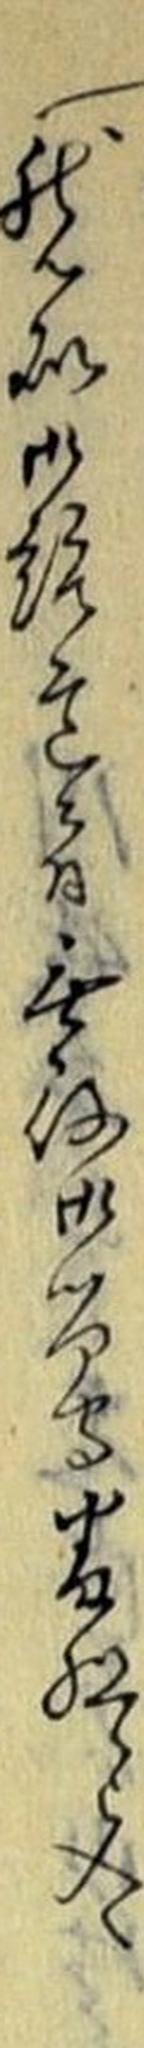然ル処御趣意に付無役御留守組へ被入候
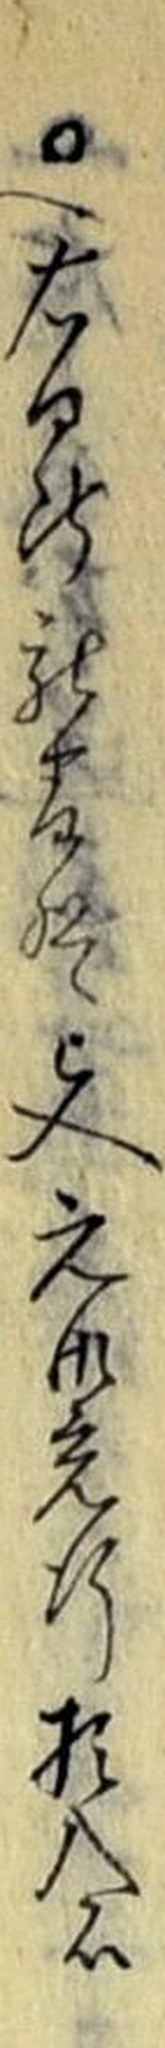○右同断新番組へ被入元御充行拾八石同人差加
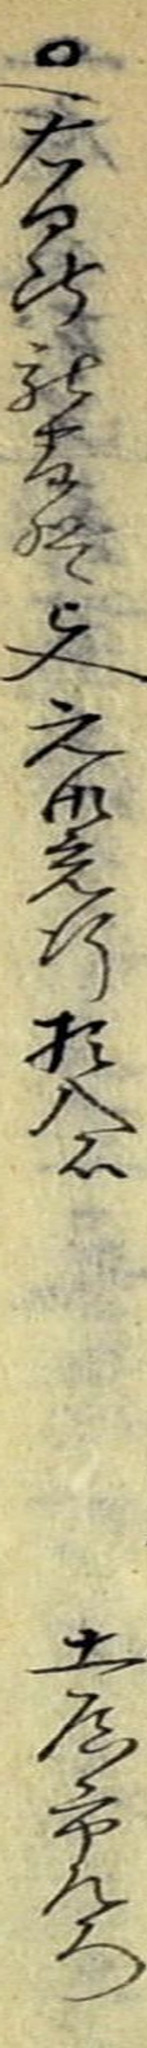○右同断新番組へ被入元御充行拾八石同人差加
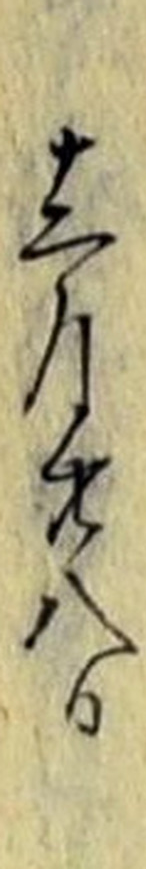十二月廿八日
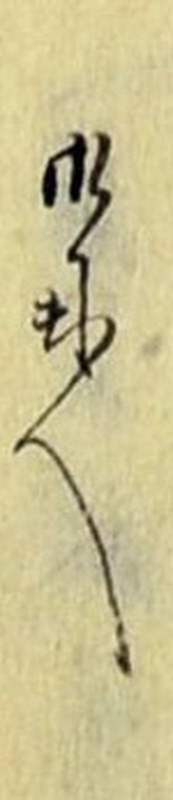御用人
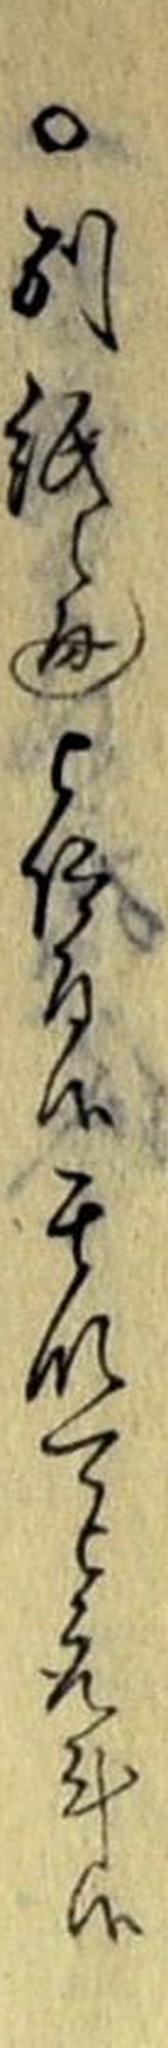○別紙之通被仰付候其段可被取斗候

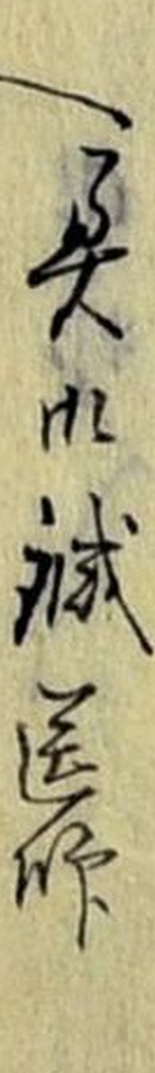奥御鍼医師
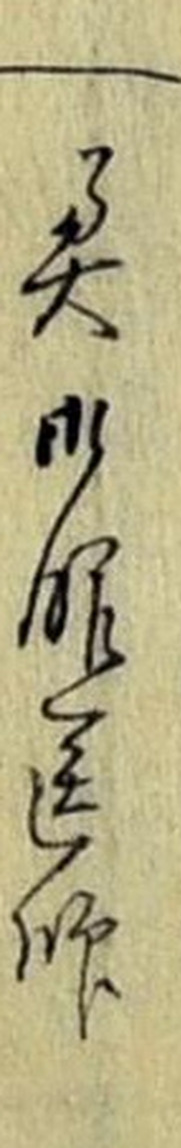奥御眼医師
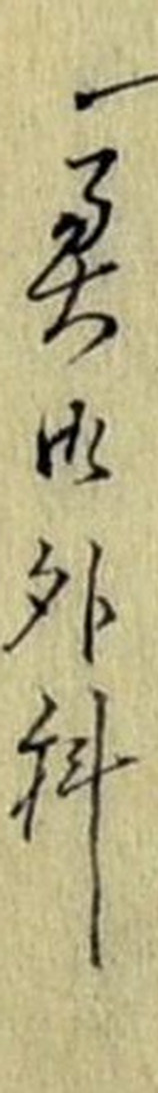奥御外科
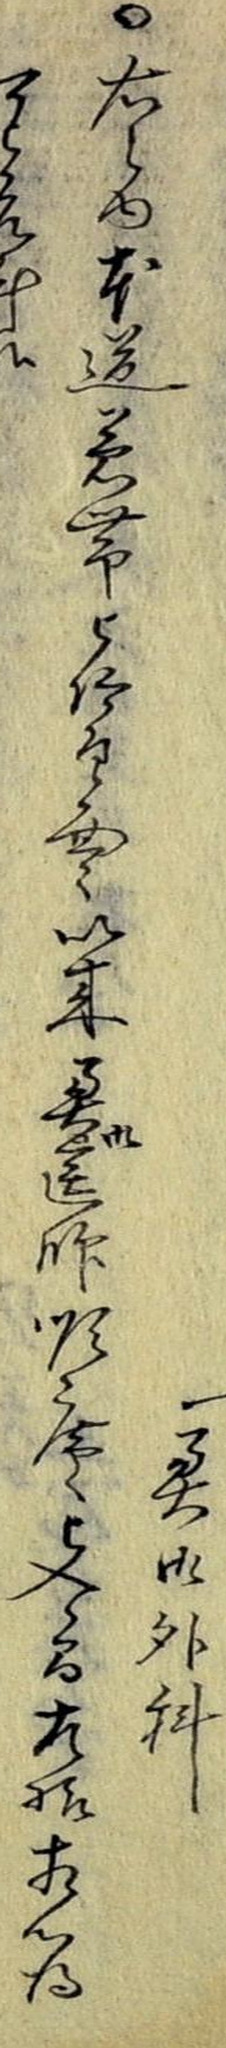○右之内本道兼帯被仰付候面々以來奥御医師順席へ被入候間左様相心得
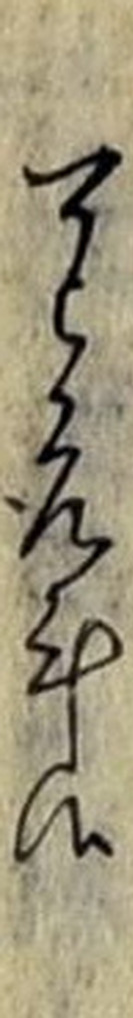科被取斗候
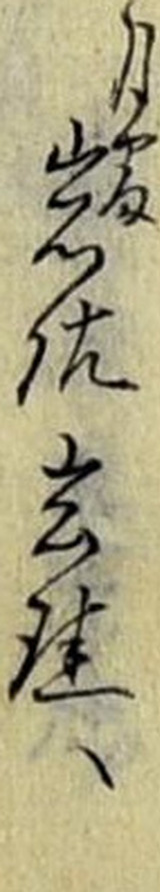岩佐玄珪へ
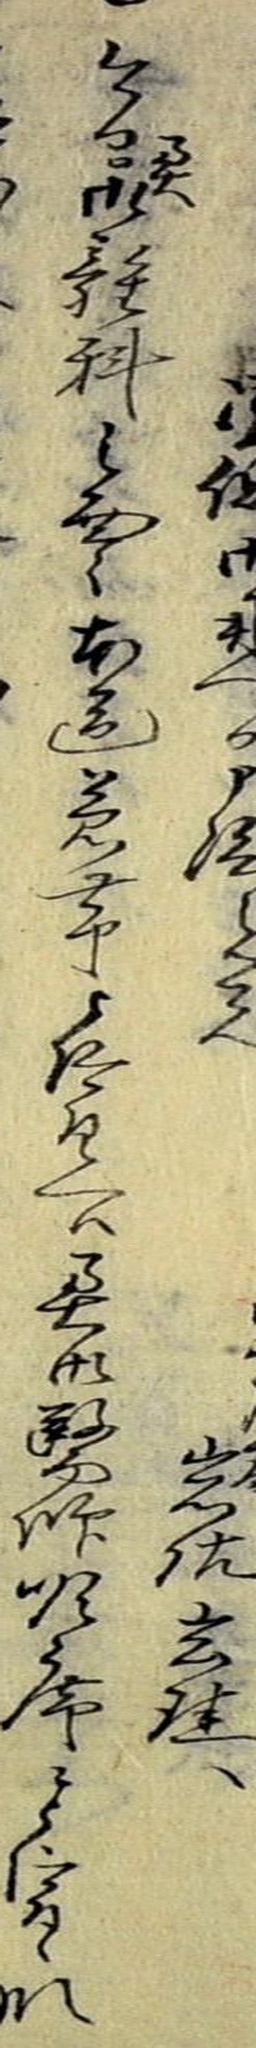○今日奥御雑科之面々本道兼帯被仰付候へは奥御医師順席に被仰付候段
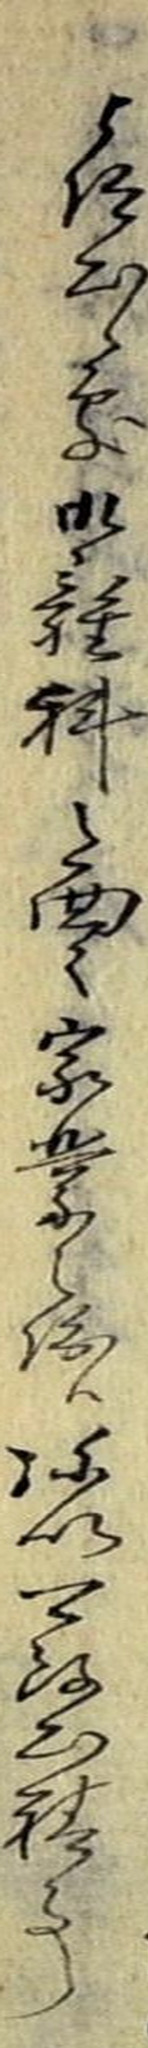被仰出候処御雑科之面々家業之儀は弥以可致出精事
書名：命令之部 六
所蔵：福井県文書館 Fukui Prefectural Archives
